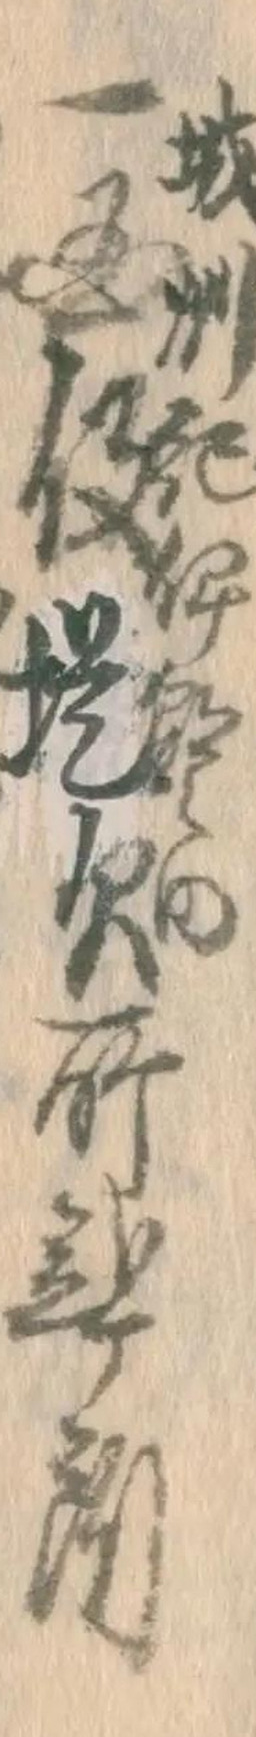一国役堤欠所弐ヶ所
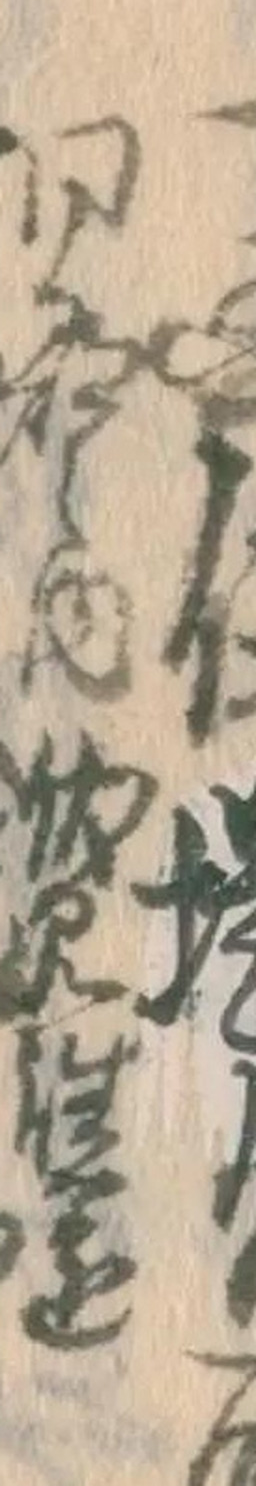同郡之内伏見街道
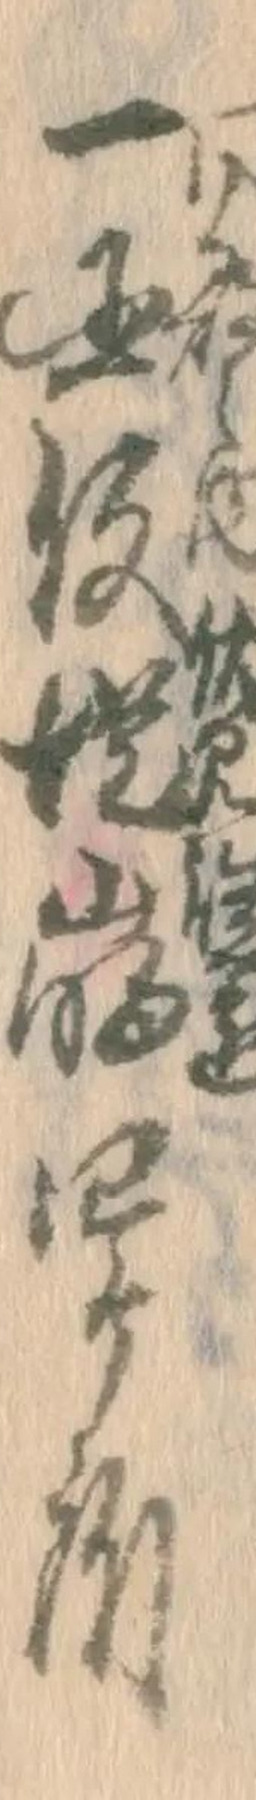一国役堤崩四ヶ所
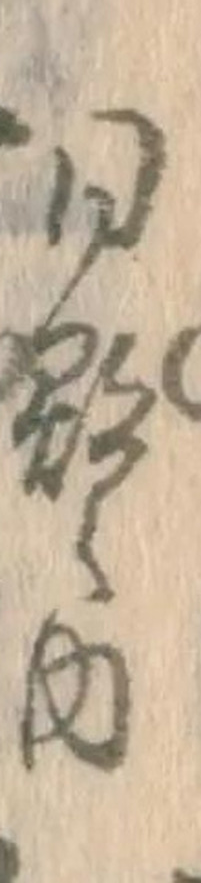同郡之内
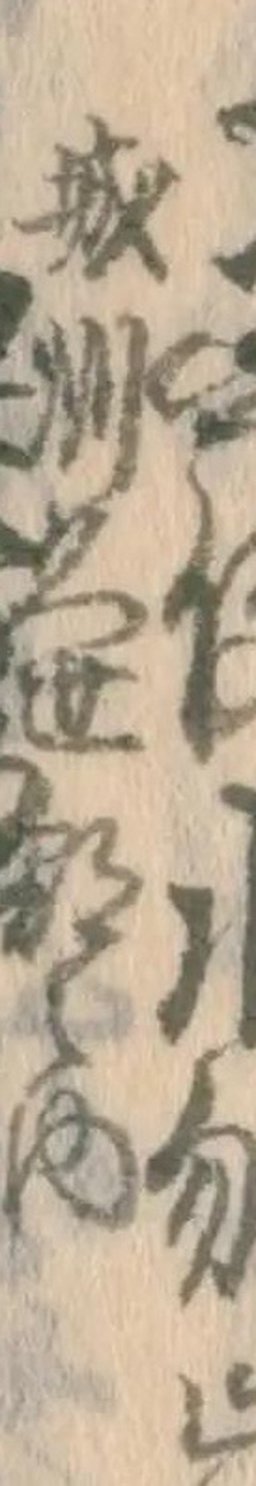城州久世郡之内
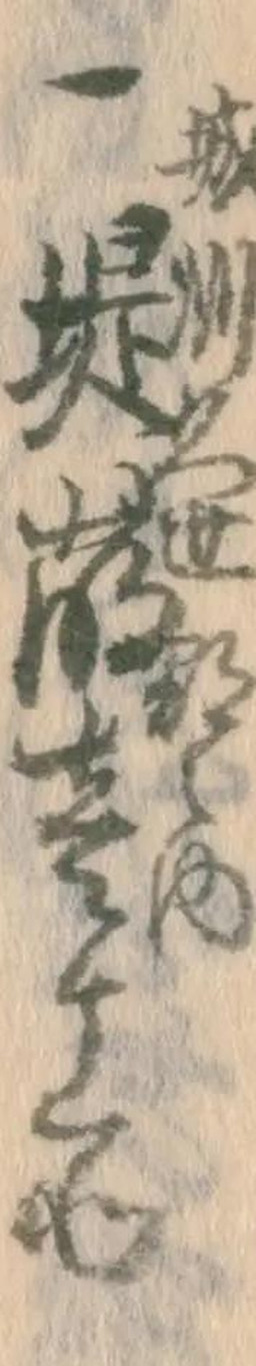一堤崩壱ヶ所
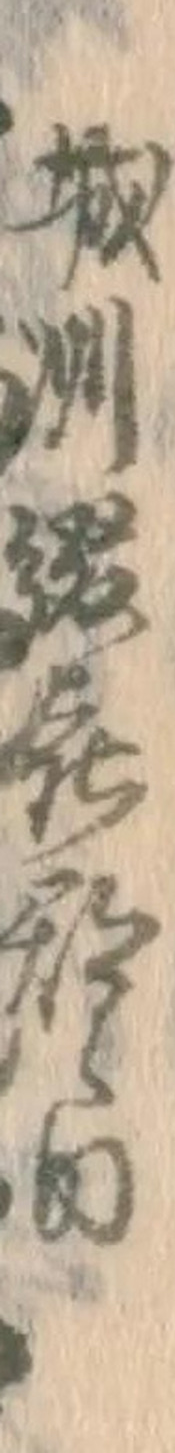城州久世郡之内
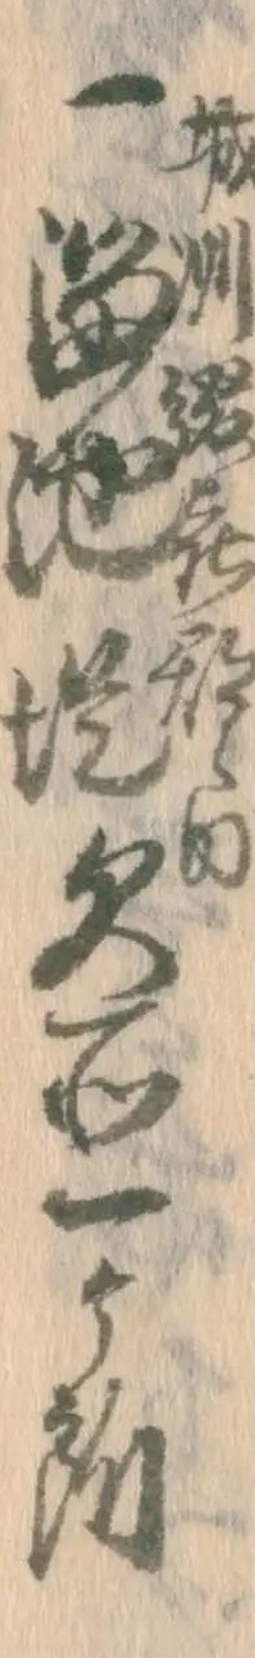一溜池堤欠所一ヶ所
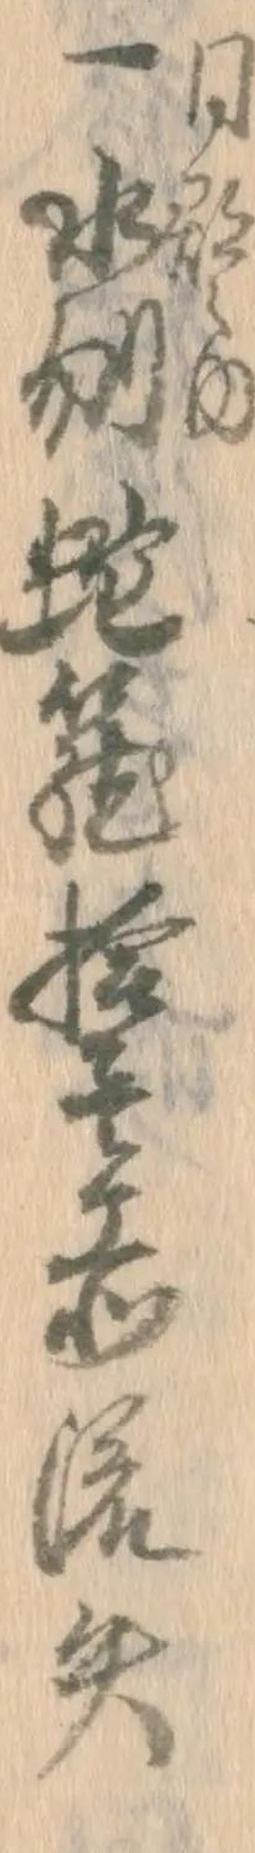一水刎蛇篭拾壱ヶ所流失
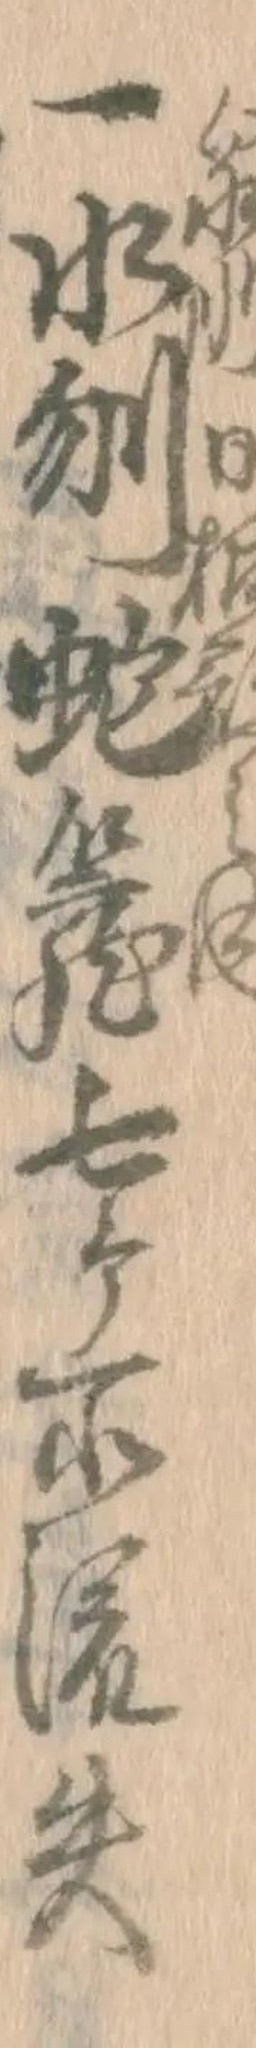一水刎蛇籠七ヶ所流失
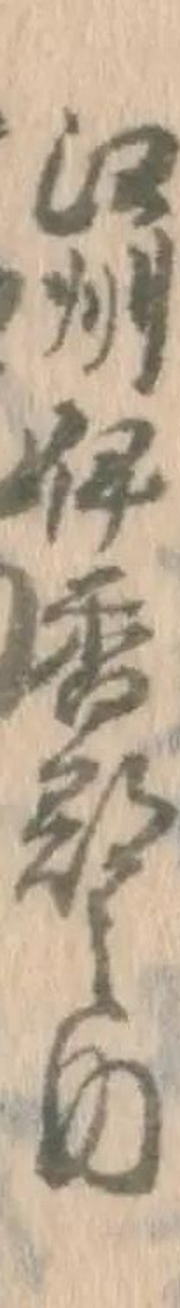江州伊香郡之内
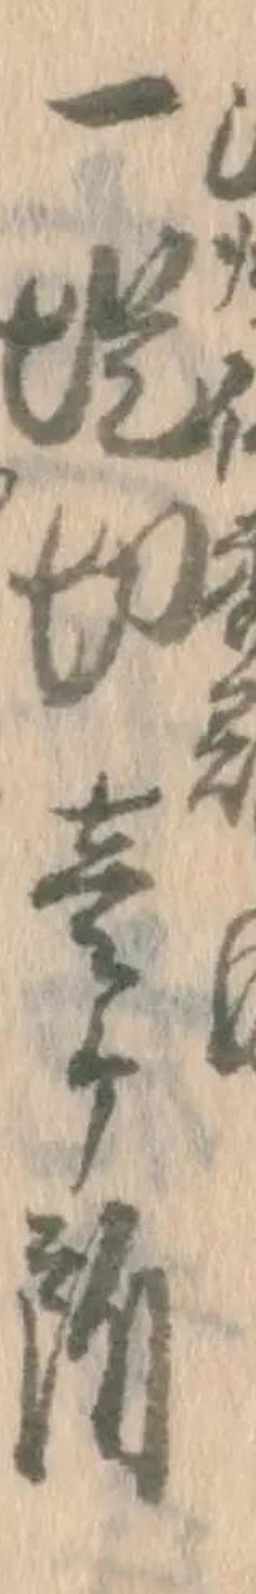一堤切壱ヶ所
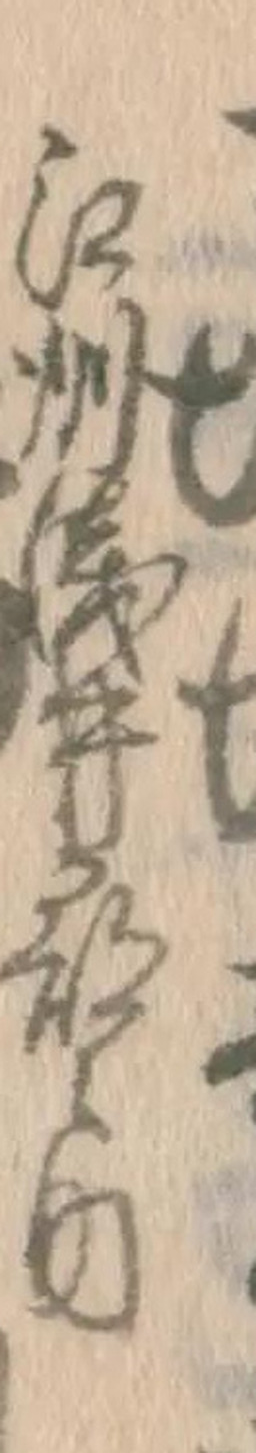江州浅井郡之内同
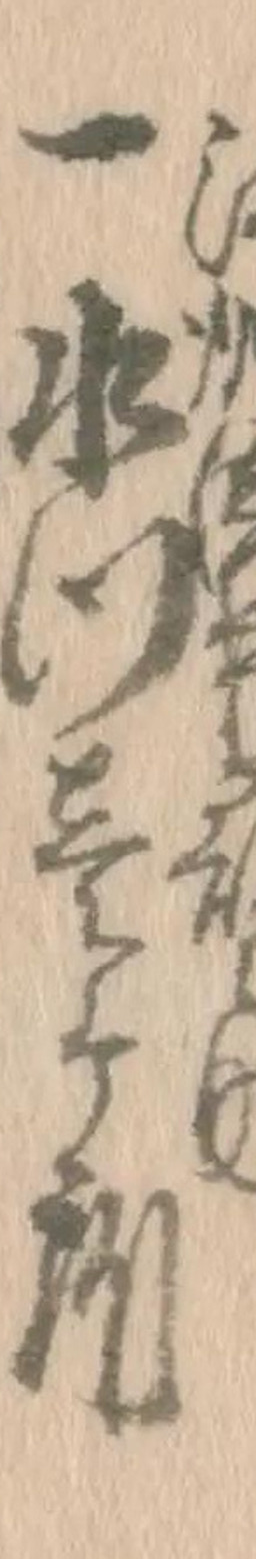一堤崩壱ヶ所
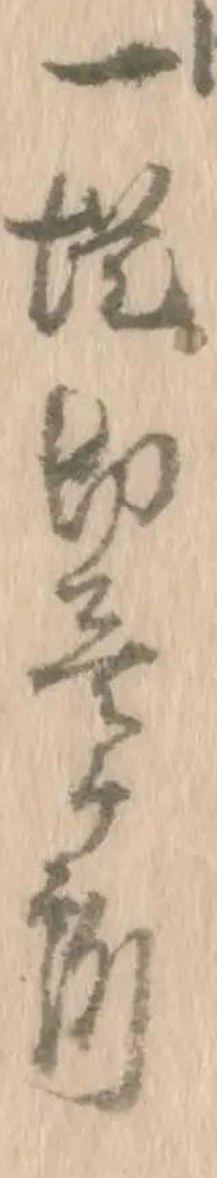一堤切壱ヶ所
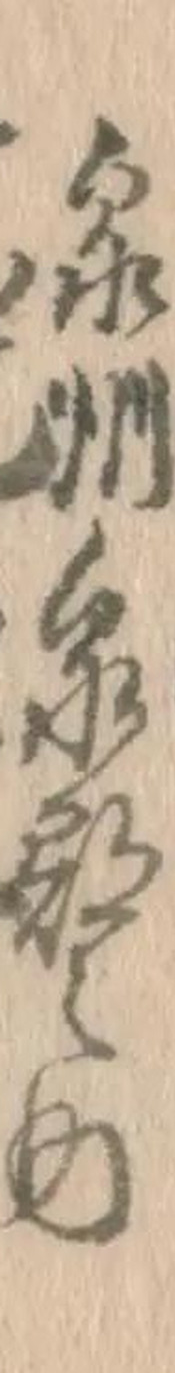泉州泉郡之内
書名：信州大地震之記
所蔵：国立国会図書館 National Diet Library, JAPAN
